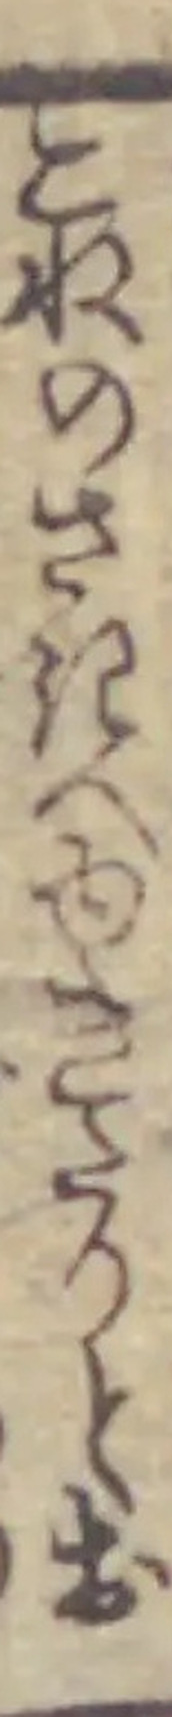こねのさきへゆきたりとおも
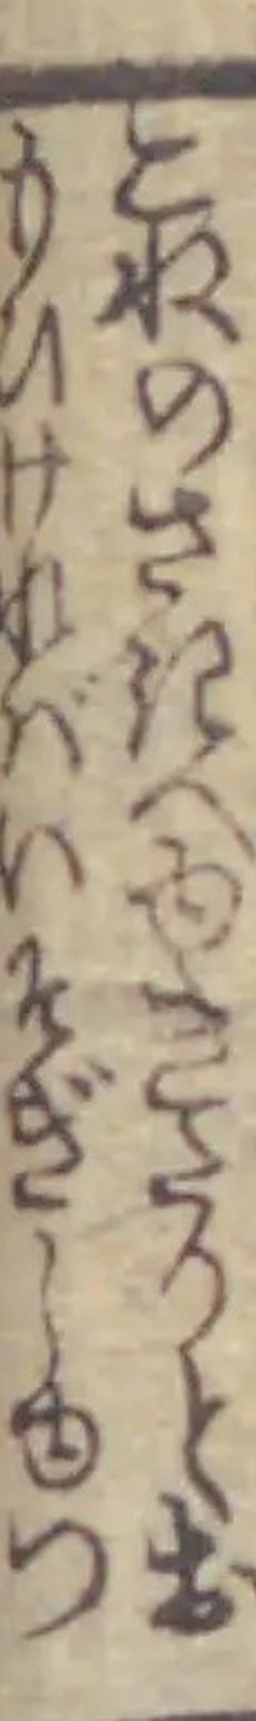ひければいそぎしゆつ
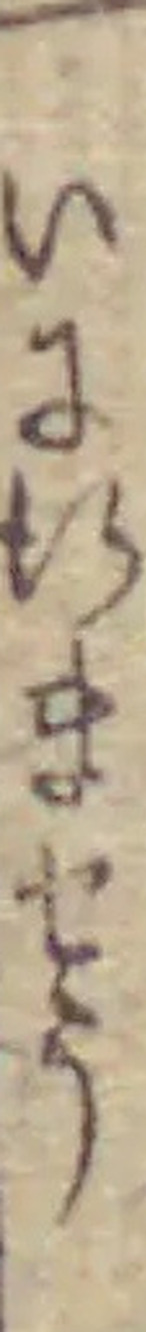いに行ませう
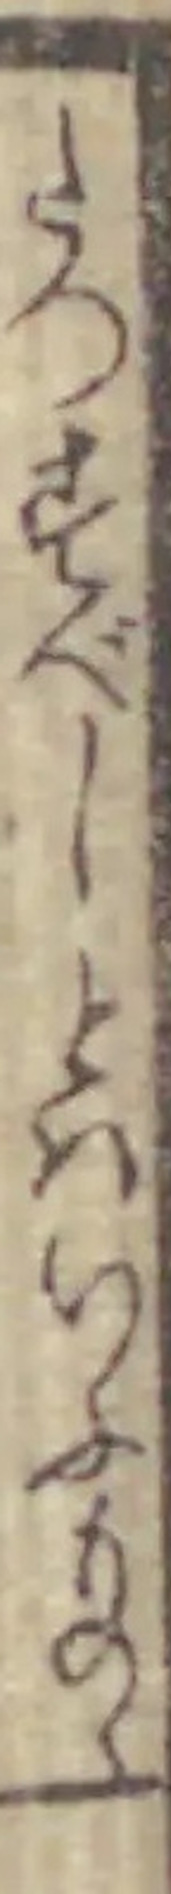たつすべしといふものゝ
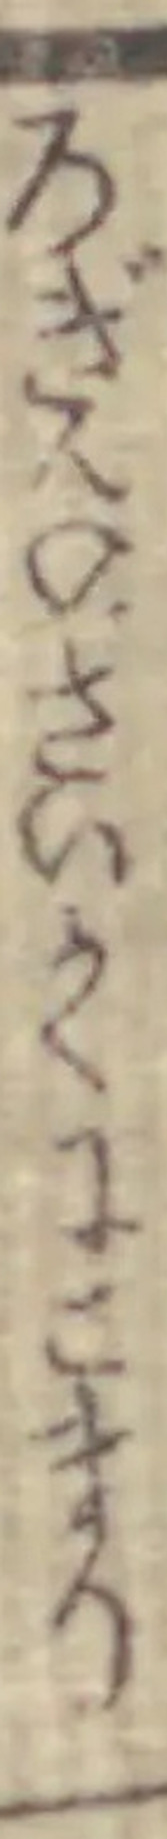ろぎんのさいかくにこまり
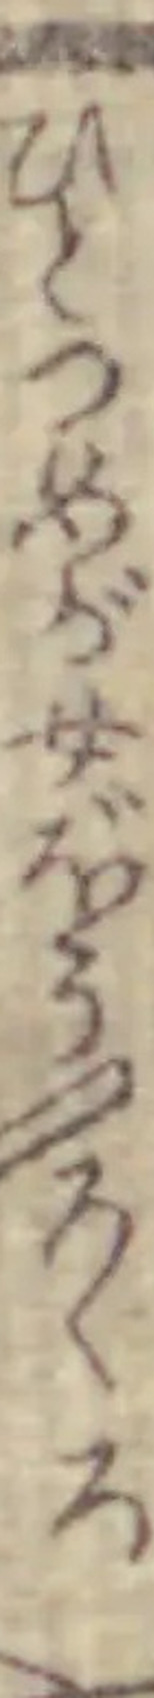ひとつめが女ぼうろくろ
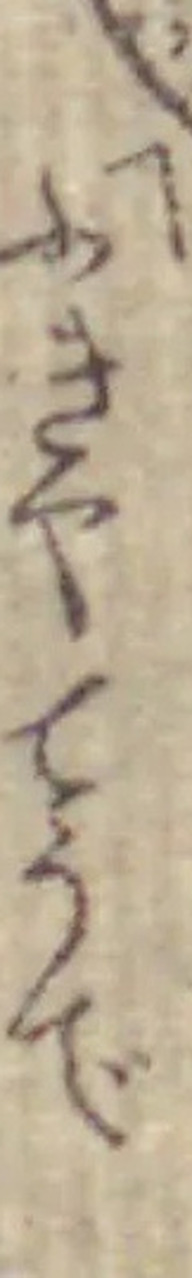〽ふきやてうで
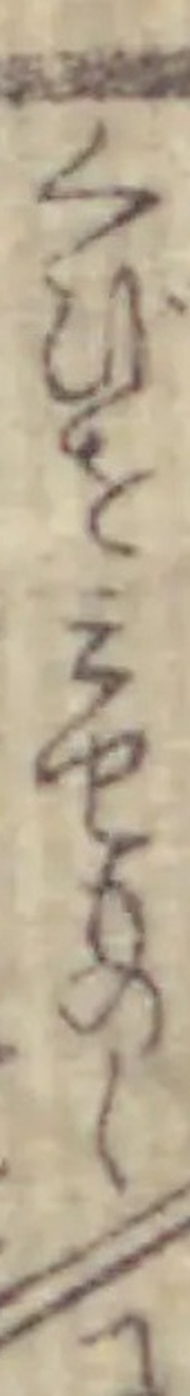くびをみせものしに
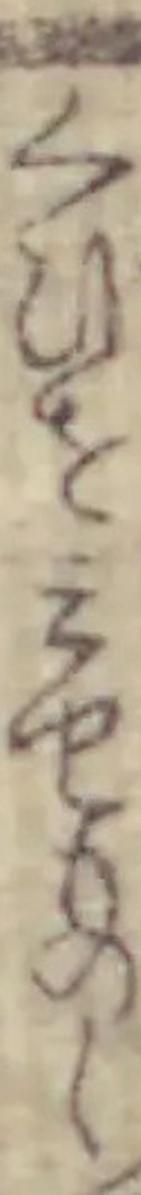くびをみせものしに
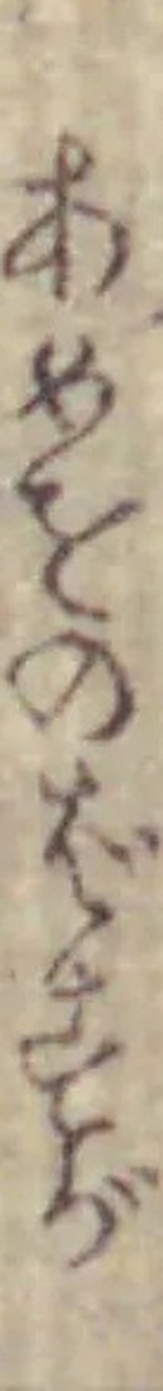あめをのばすが
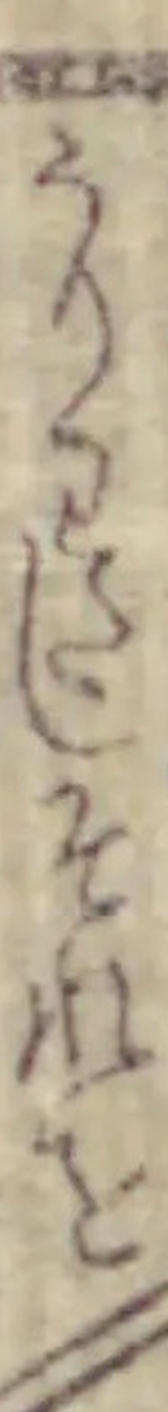うりわたしそれを
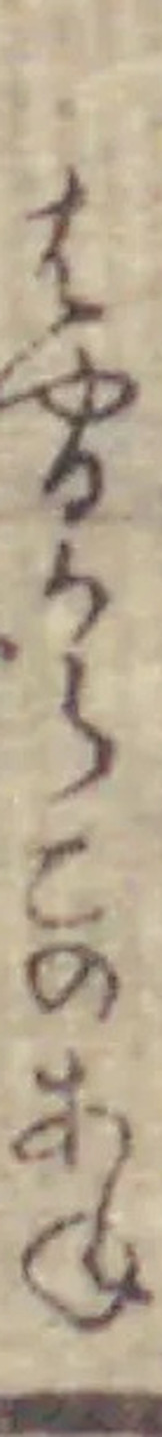はやるからこのあね
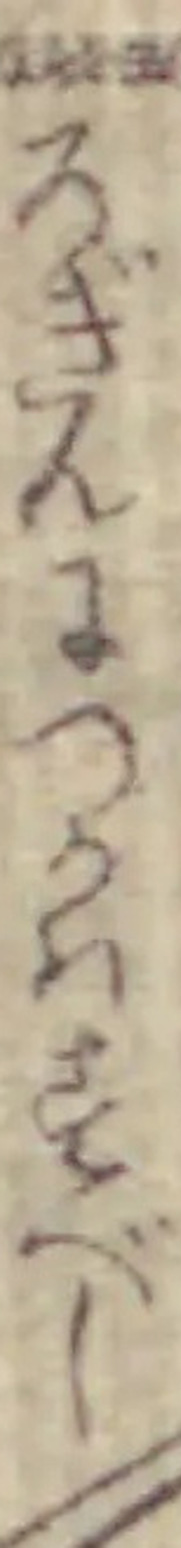ろぎんにつかはすべし
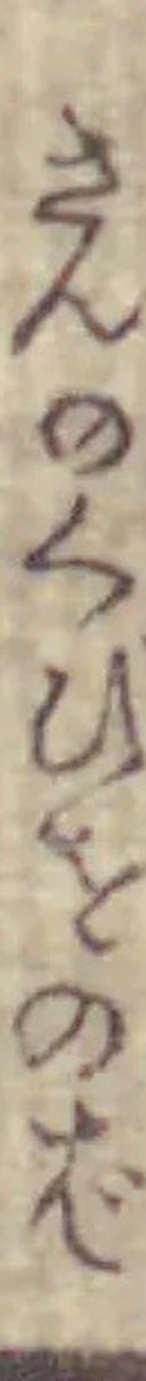さんのくびをのば
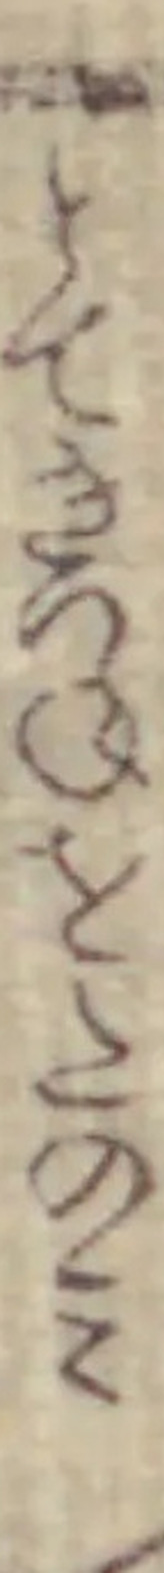とてきつねをたのみ
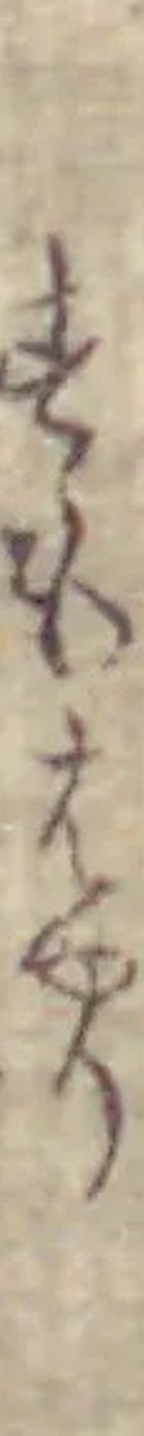すもはやり
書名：化物敵討 2巻
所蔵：国立国会図書館 National Diet Library, JAPAN
